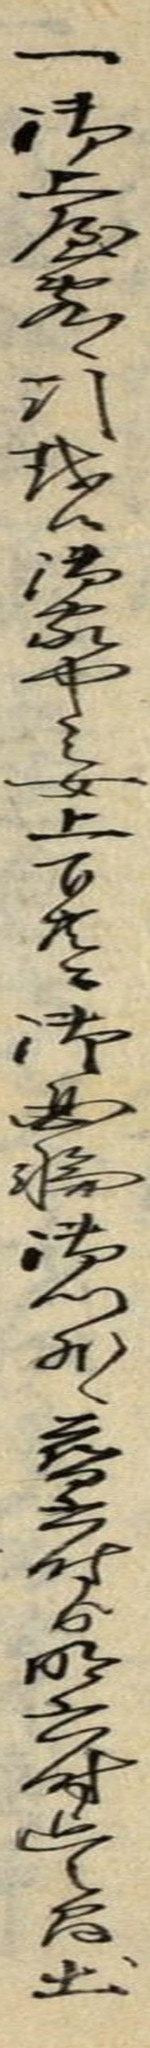一御上屋敷へ引越候御家中之女上下共に御曲輪御門外へ暮六時ゟ明六時迄之間出
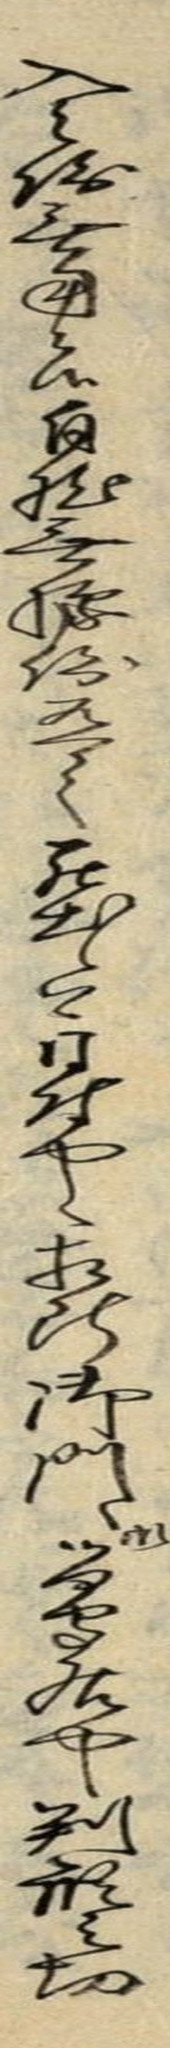入之儀無用に候自然無拠儀有之罷出候はゝ目付中へ相断御門へ御留守居中判形之切
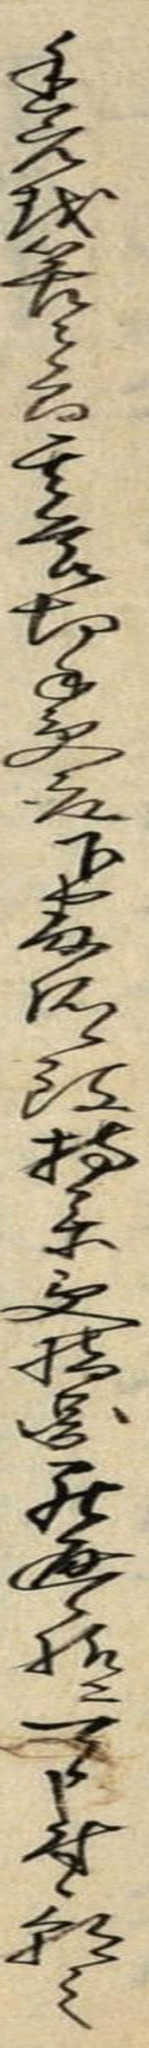手差越筈に候間其節切手受取下番所へ致持参受指図罷通候様に可申付候朝之
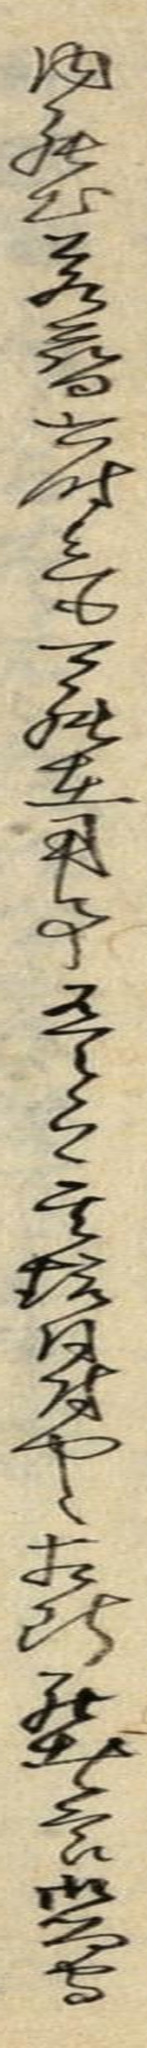内罷出若暮六時迄も可罷在用事有之候はゝ其趣目付中へ相断罷出候節御留守
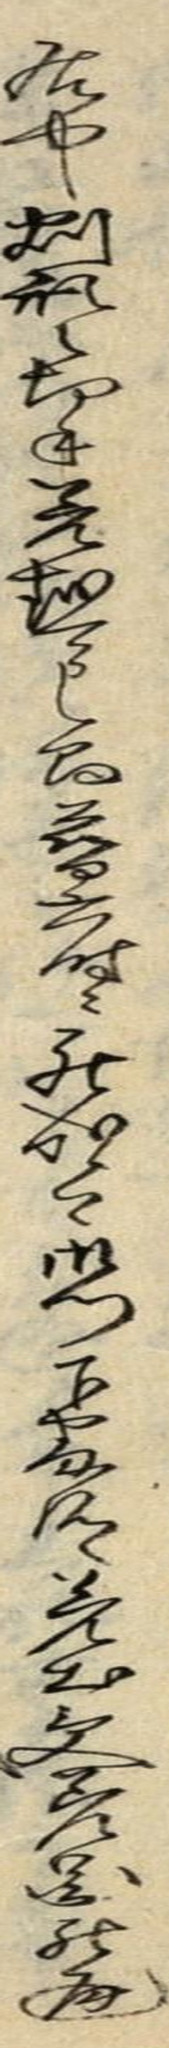居中判形之切手差越可申候間暮六時に罷成候はゝ御門下番所へ差出受差図罷通
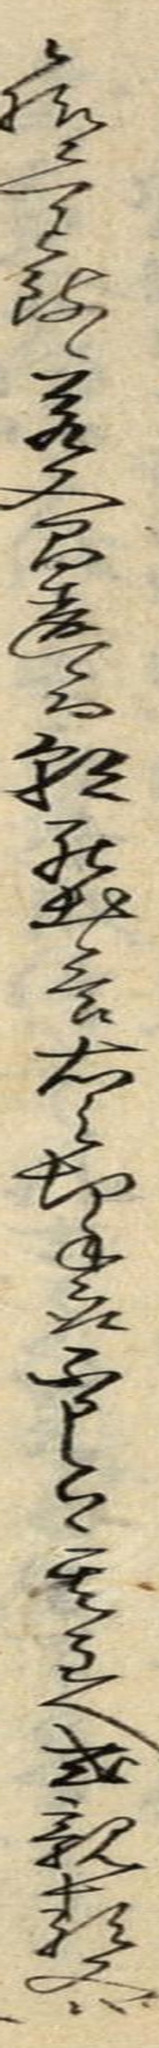候様に可被致候若又間違候て朝罷出候節右之切手取不申候はゝ其主人或親類又は
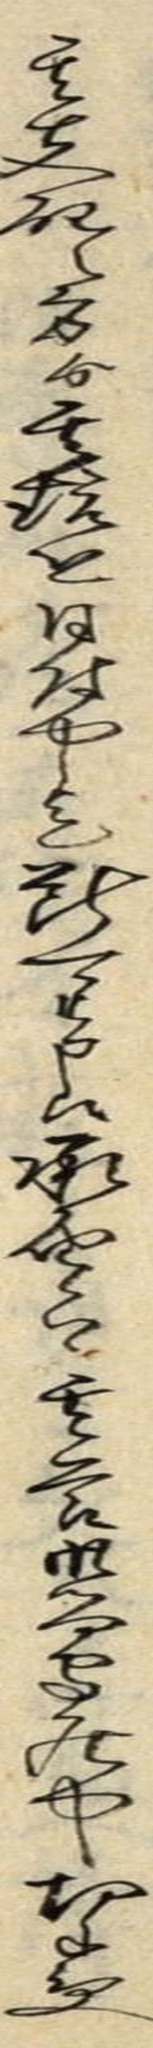其支配之方ゟ其趣を目付中迄断可被申候承届候はゝ其節御留守居中切手受
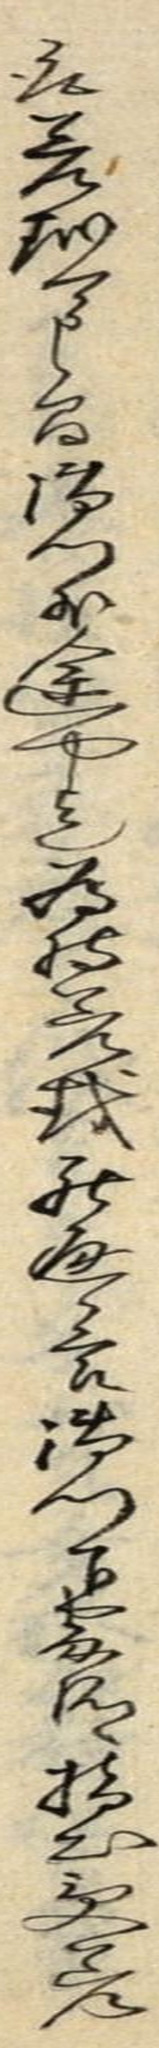取差越可申候間御門外途中迄為持差越罷通候節御門下番所へ指出受差
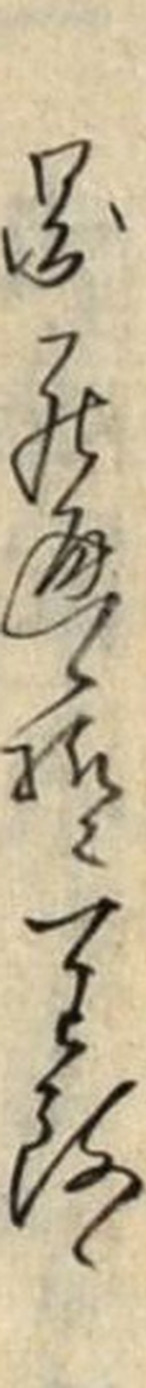図罷通候様に可被致候
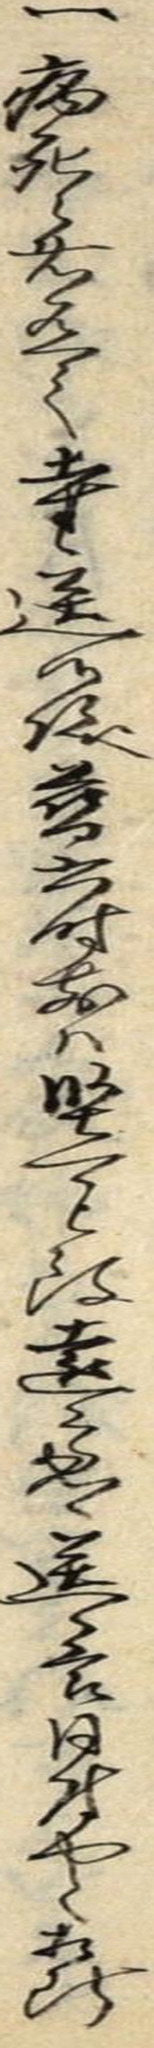一病死之者有之寺へ送候儀暮六時前は堅可被致遠慮候送候節目付中へ相断
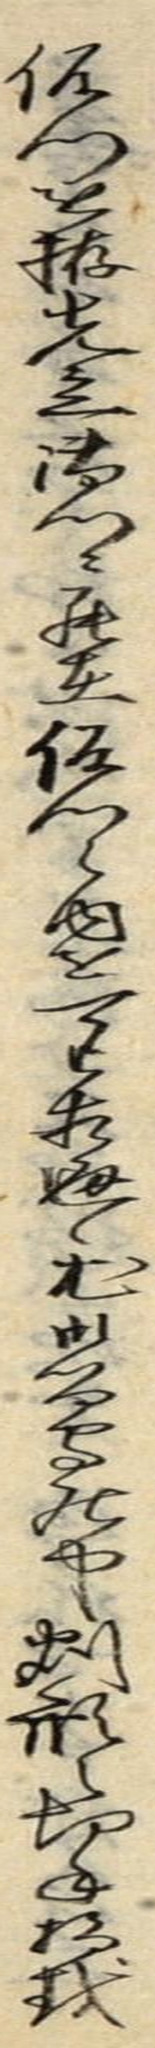仮門を拵先立御門に罷在仮門之内を可被相通候尤御留守居中判形之切手指越

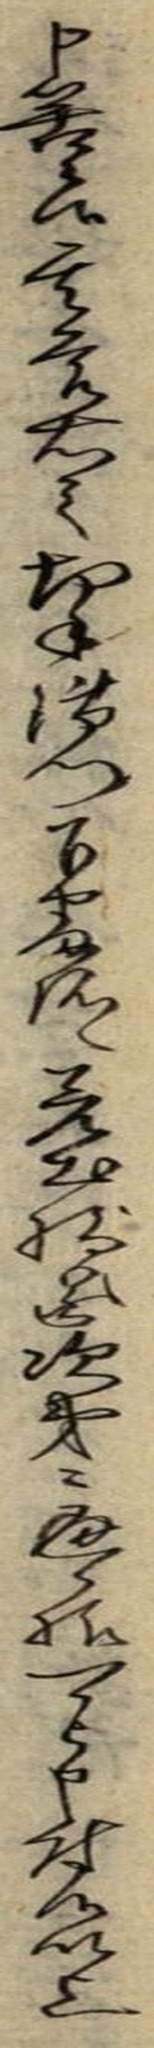申筈に候其節右之切手御門下番所へ差出指図次第に通候様可被申付候以上
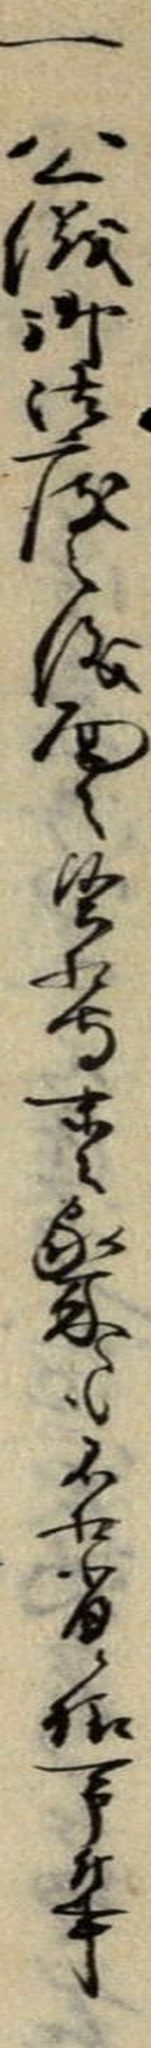一公儀御法度之儀面々堅相守末々家来も不相背候様可申付事
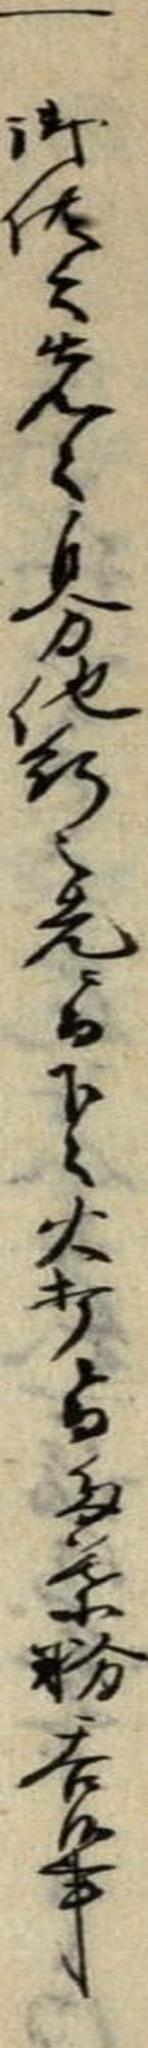一御供者先々自分他行之先にて下々火打にて多葉粉呑候事
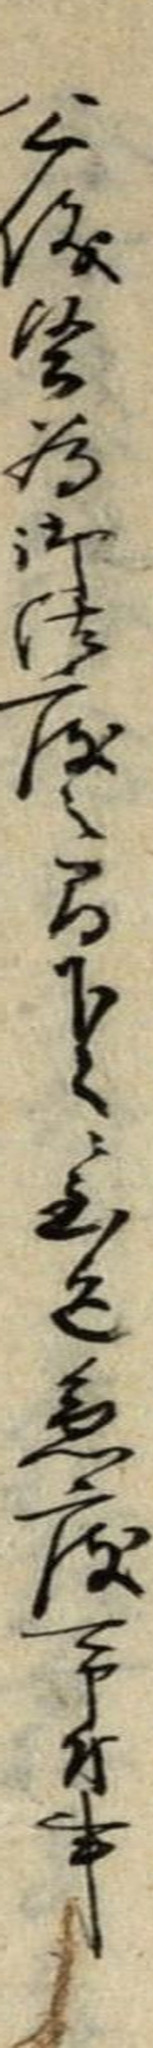公儀堅為御法度之間下々に至迄急度可申付事
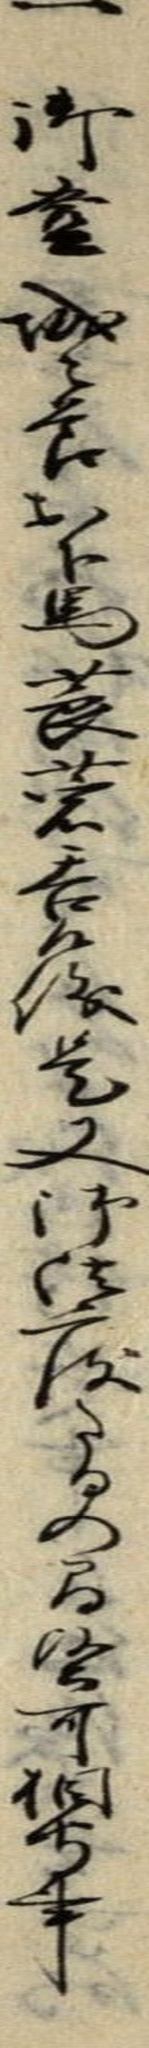一御登城之節於下馬莨菪呑候儀是又御法度たるの間堅可相守事
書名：三都并道中之部
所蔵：福井県文書館 Fukui Prefectural Archives
